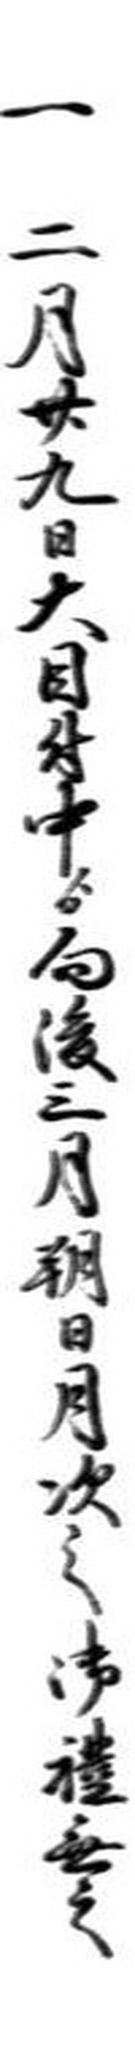一二月廿九日大目付中ゟ向後三月朔日月次之御礼無之
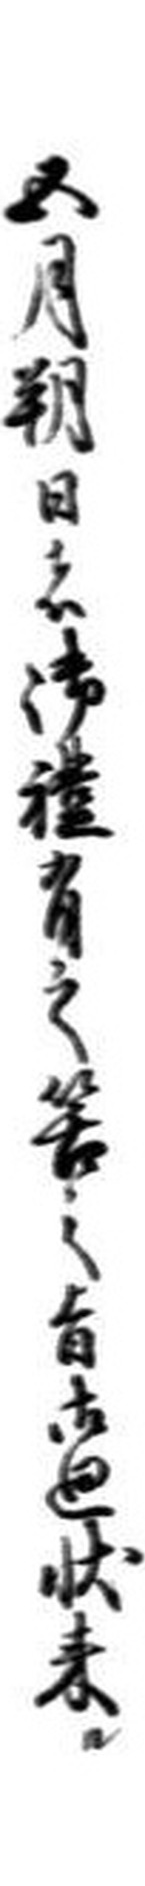五月朔日者御礼有之筈之旨御廻状来ル
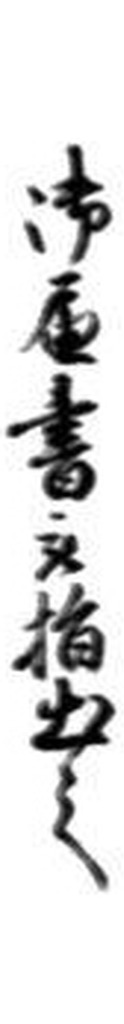御届書被指出之
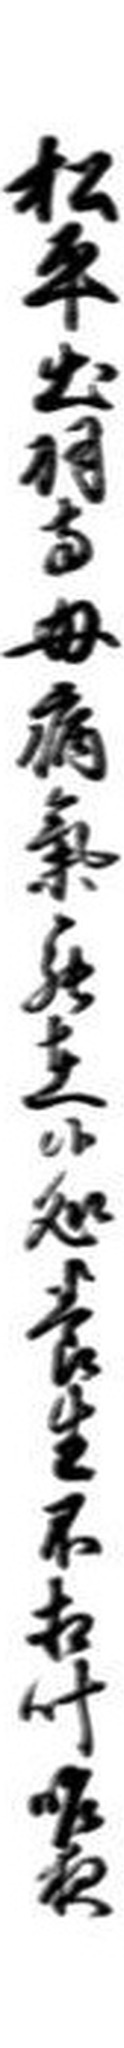松平出羽守母病気罷在候処養生不相叶昨夜

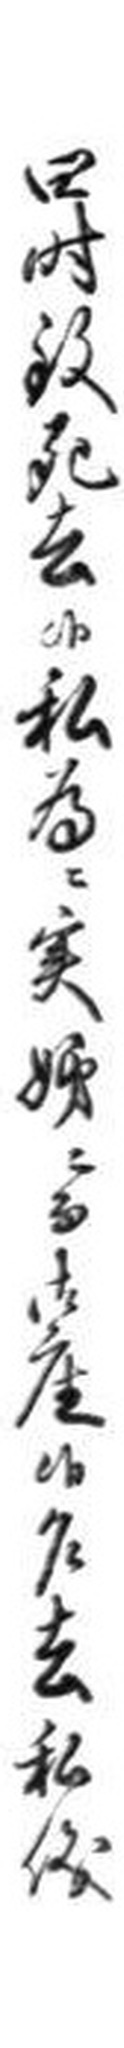四時致死去候私為ニ実姉ニ而御座候乍去私儀
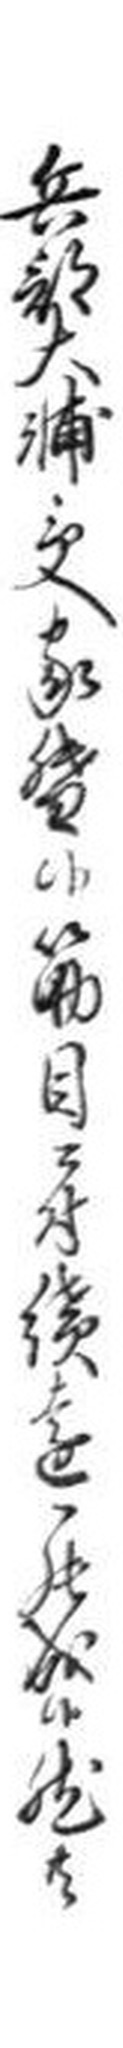兵部大輔受家督候筋目ニ付続遠罷成候然共
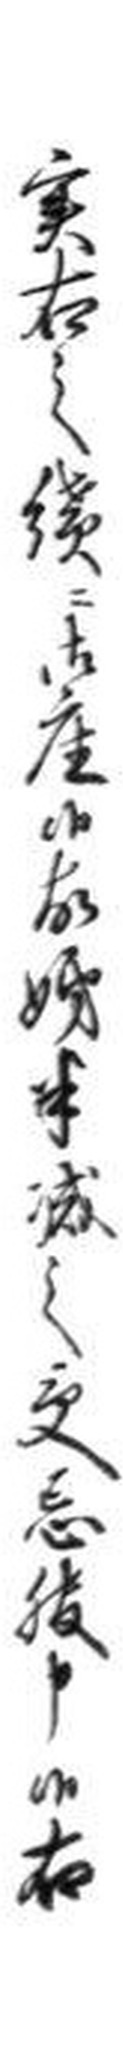実右之続ニ御座候故姉半減之受忌服申候右
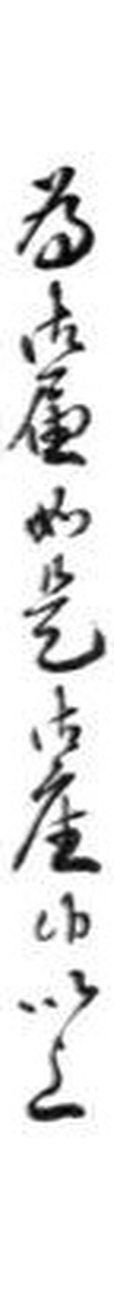為御届如是御座候以上
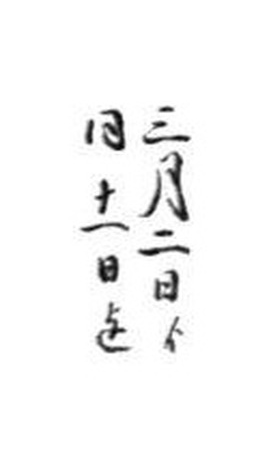同十一日迄
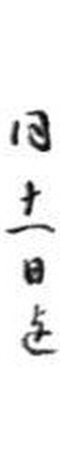同十一日迄
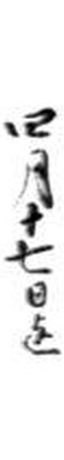四月十七日迄
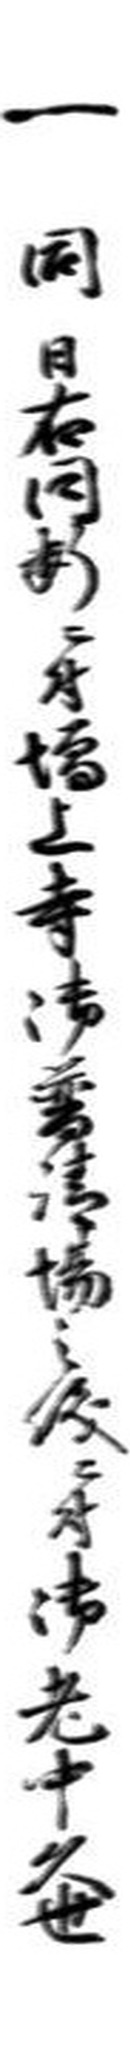一同日右同断ニ付増上寺御普請場之儀ニ付御老中久世
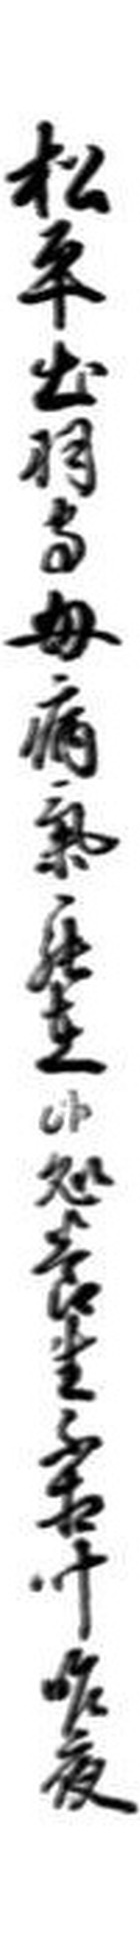松平出羽守母病気罷在候処養生不相叶昨夜
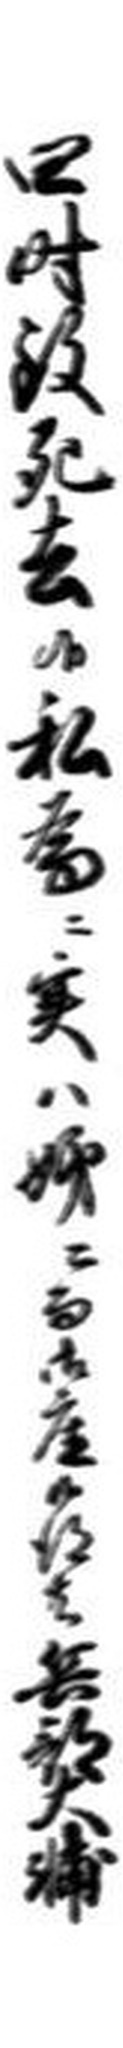四時致死去候私為ニ実ハ姉ニ而御座候得共兵部大輔
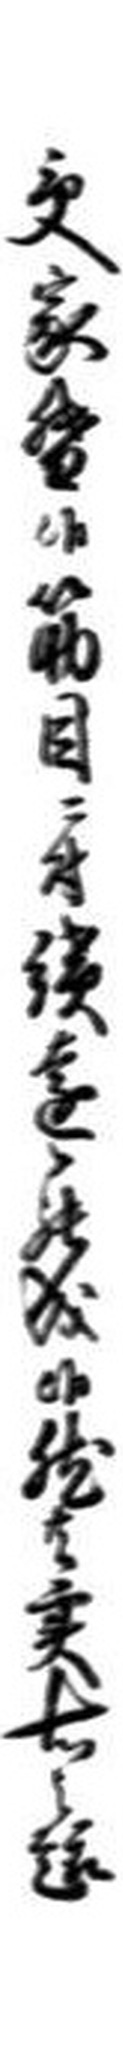受家督候筋目ニ付続遠罷成候然共実右之趣
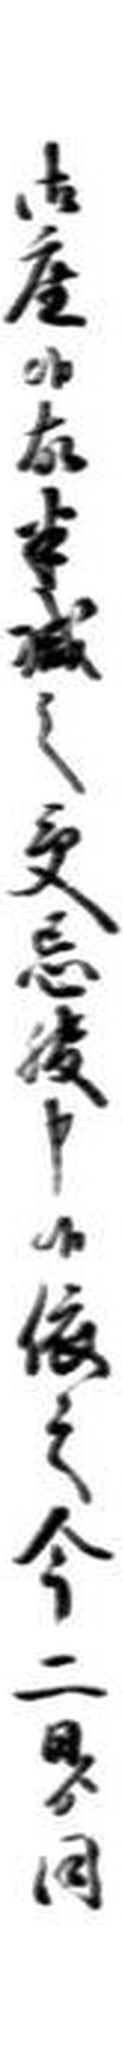御座候故半減之受忌服申候依之今二日ゟ同
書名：家譜 三十二 吉邦公 従享保二年到享保三年
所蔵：福井県文書館 Fukui Prefectural Archives
